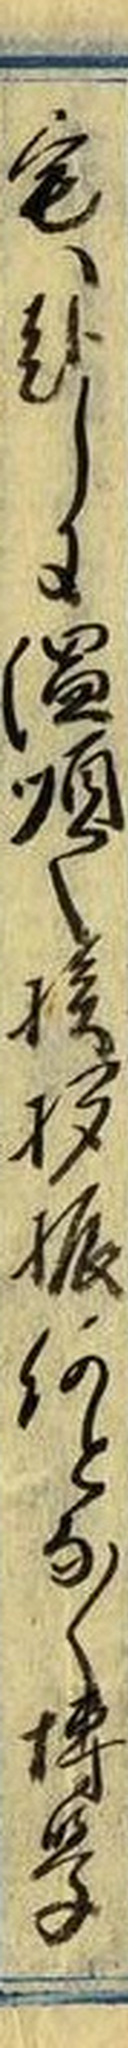宅へ赴しに温順之挨拶振何となく博学
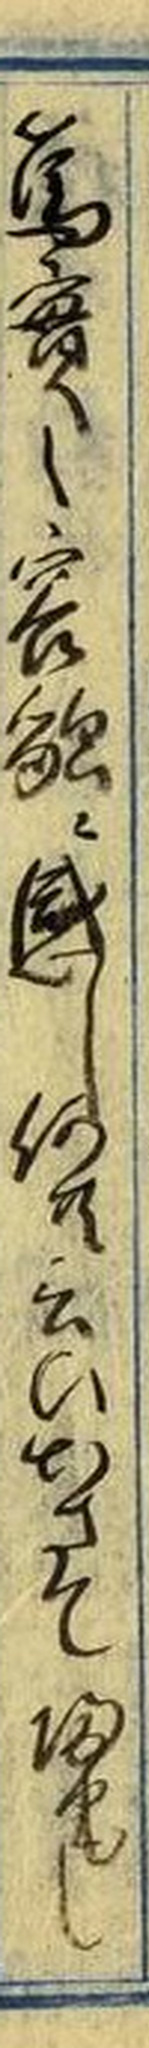篤実之容貌に感し何共言ひ出さて帰宅し
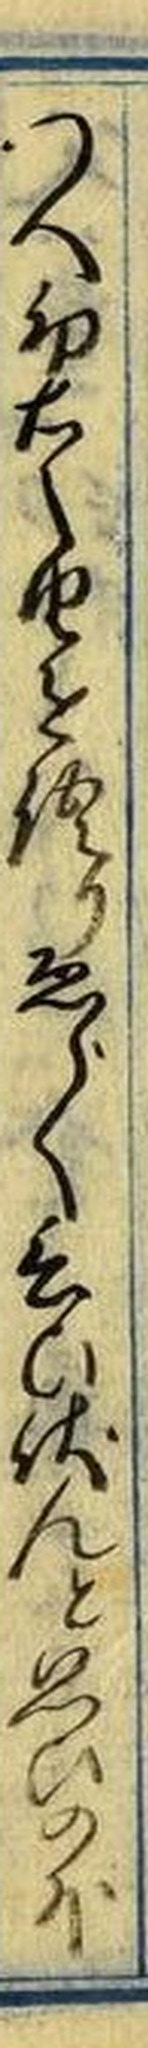同人初右之由を語りゑらく言い伏んと思ひの外
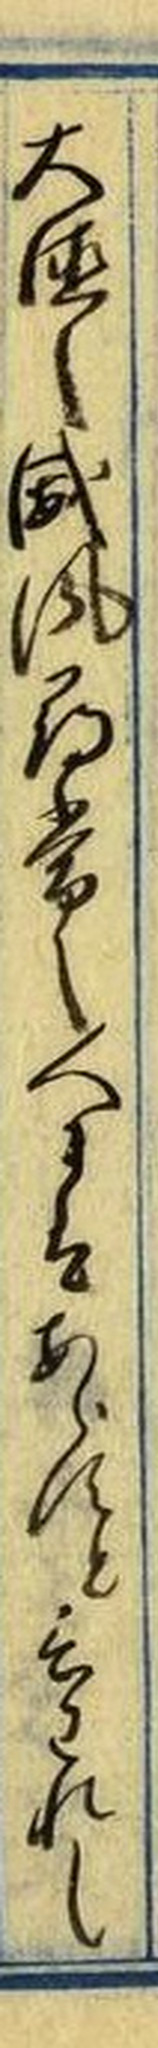大徳之威風尋当之人にはあらすと言われし
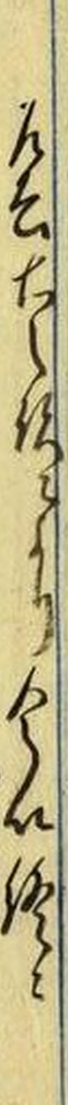乍去右之訳により今以終に
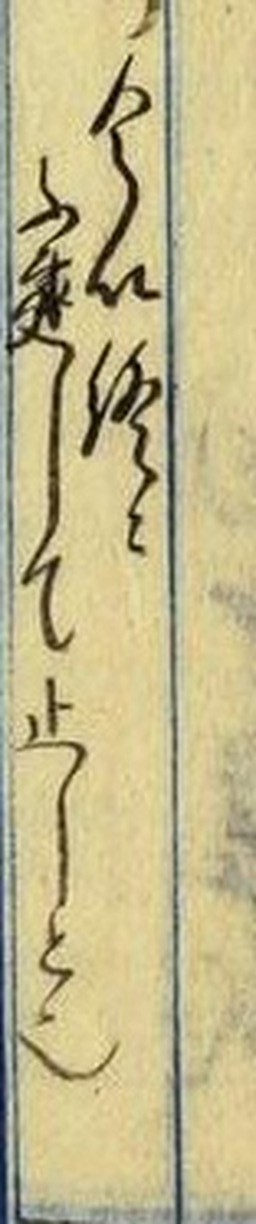不建して止しと也
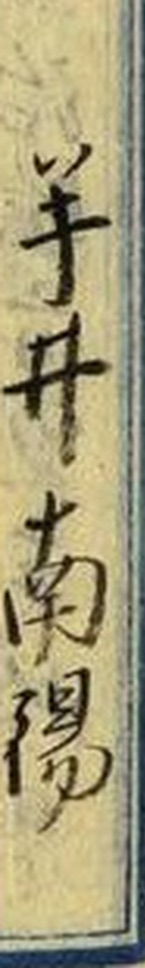半井南陽
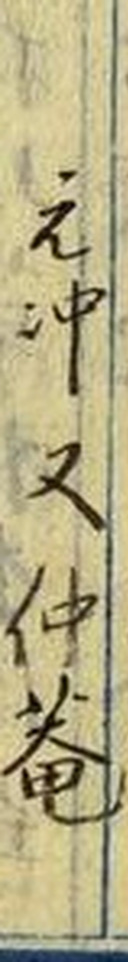元冲又仲菴
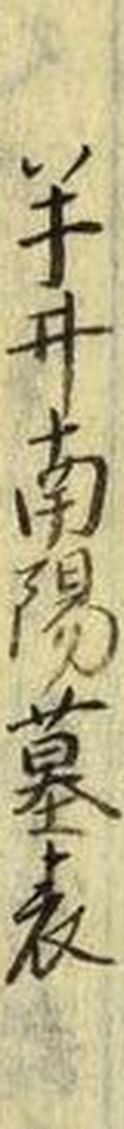半井南陽墓表
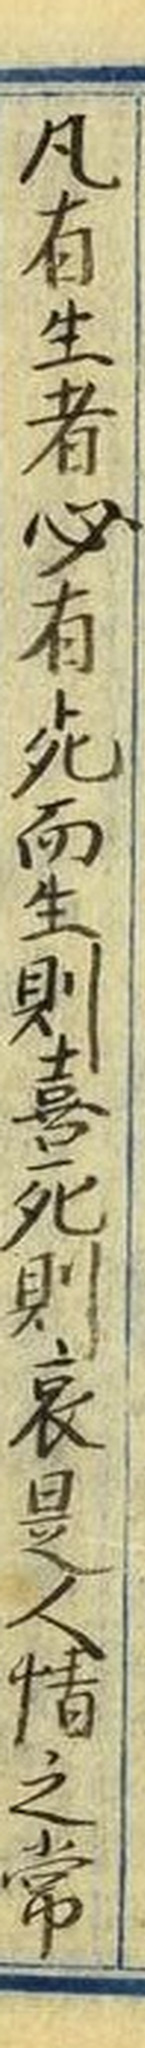凡有生者必有死而則喜死則哀是人情之常
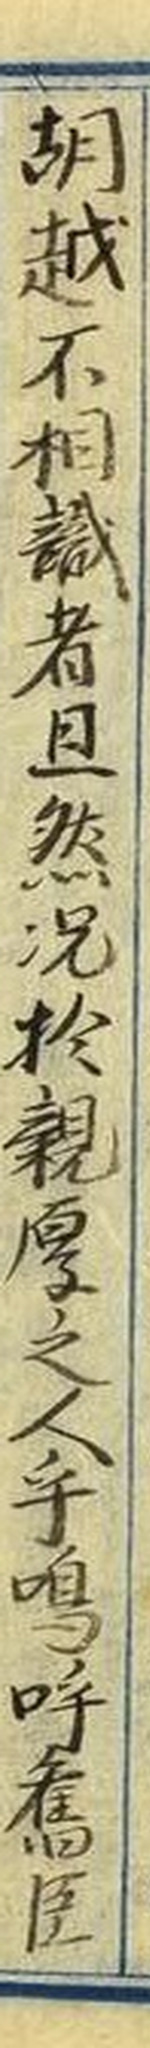胡越不相識者且然况於親厚之人乎嗚呼𦾔臣
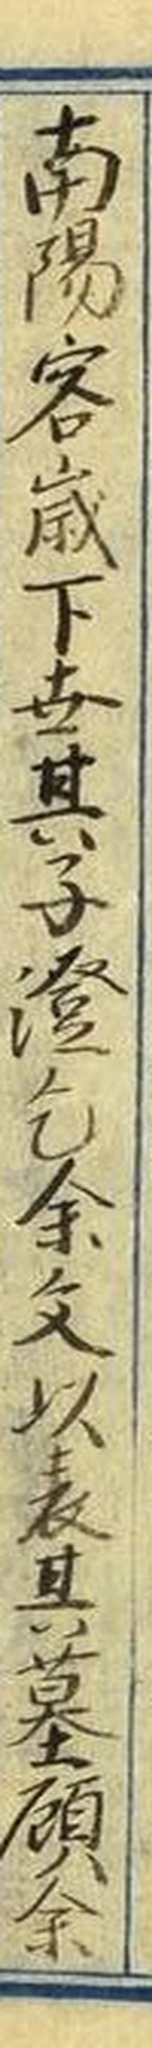南陽客歳下世其子澄乞余文以表其墓願余
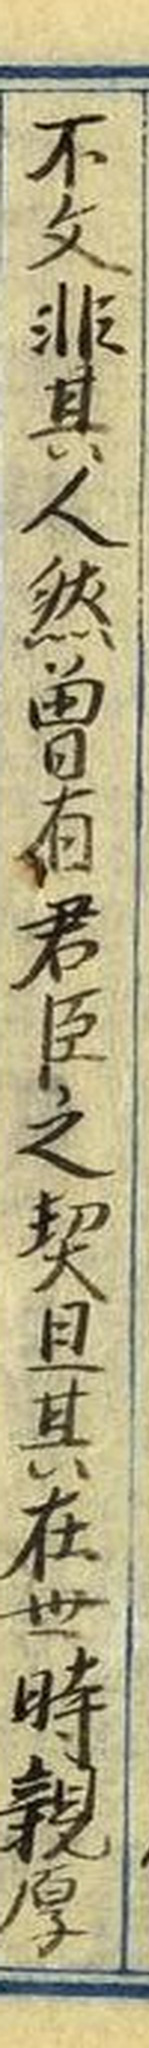不文非其人然曽有君臣之契且其在世時親厚
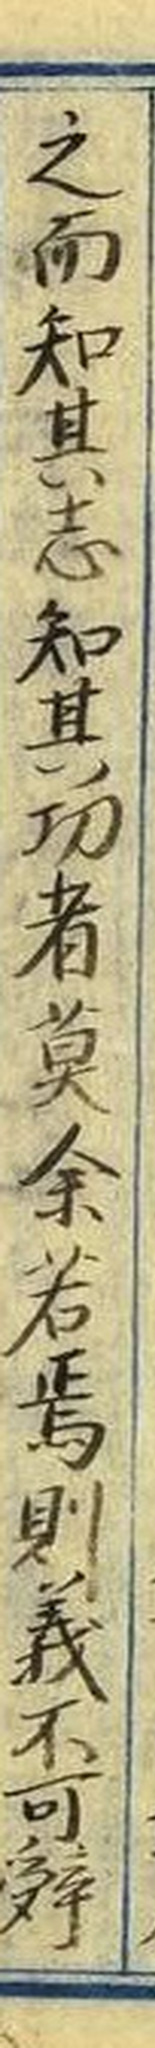之而知其志知其㓛者莫余若焉則義不可辤
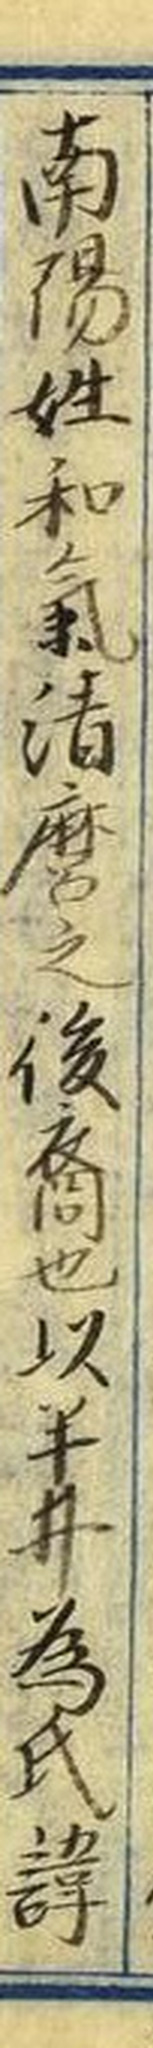南陽姓和氣清麿之後裔也以半井為氏諱
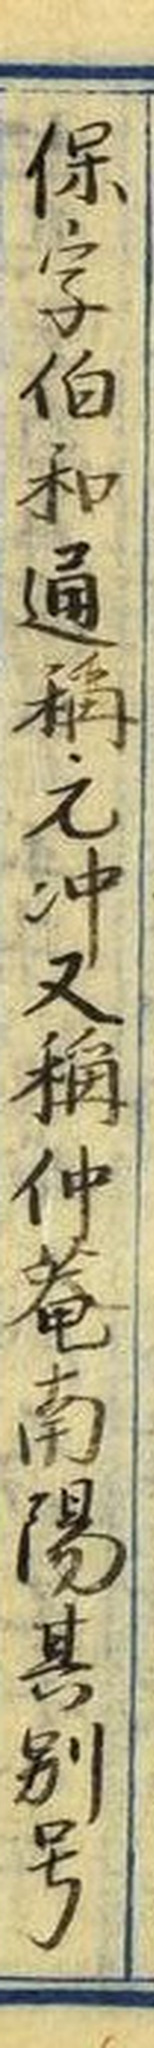保字伯和通稱元冲又稱仲菴南陽其別号
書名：温古集 四巻
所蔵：福井県文書館 Fukui Prefectural Archives
